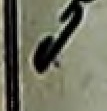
5
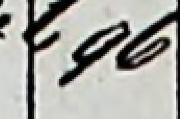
1,96
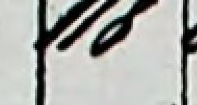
118
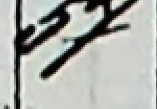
57
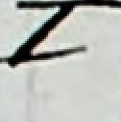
I
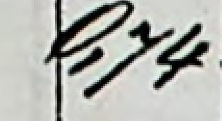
0,74
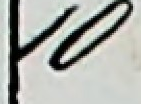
10
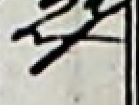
27
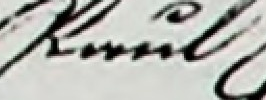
Paul
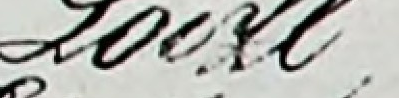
Loidl
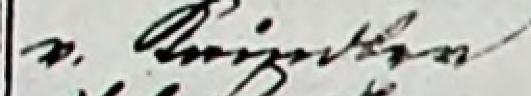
v. Kaindler
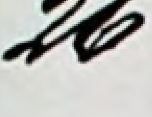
26
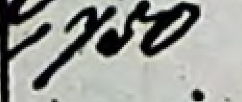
0,750
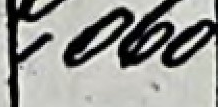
0,060
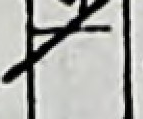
7
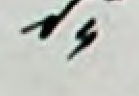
Do
